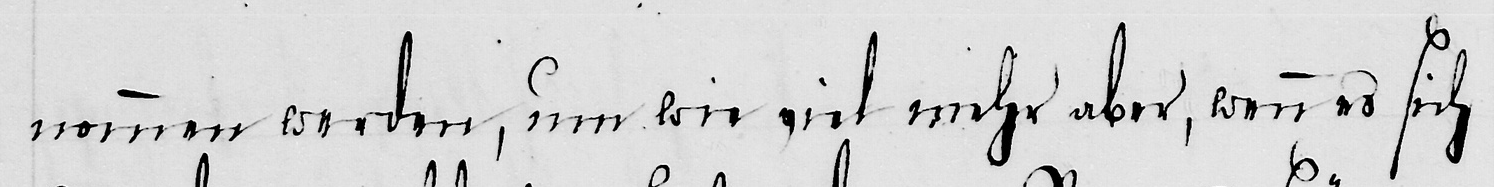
nommen werden, um wie viel mehr aber, wenn es sich
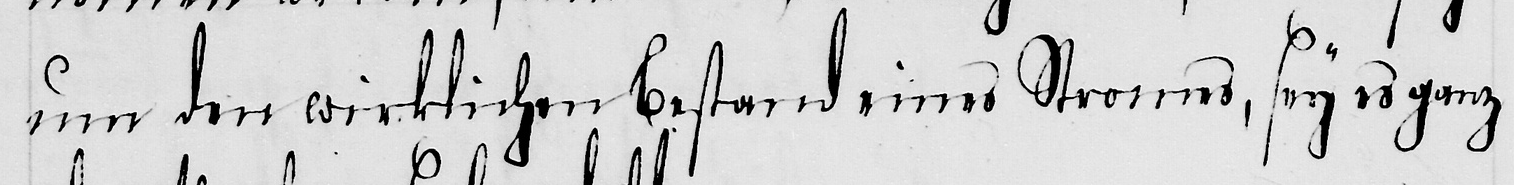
um den wirklichen Bestand eines Stromes, sey es ganz
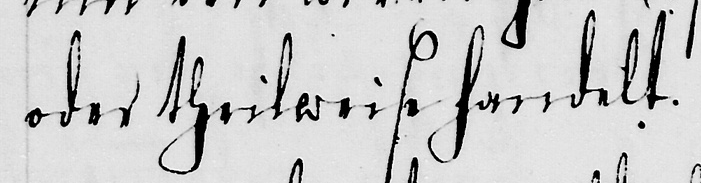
oder theilweise handelt.
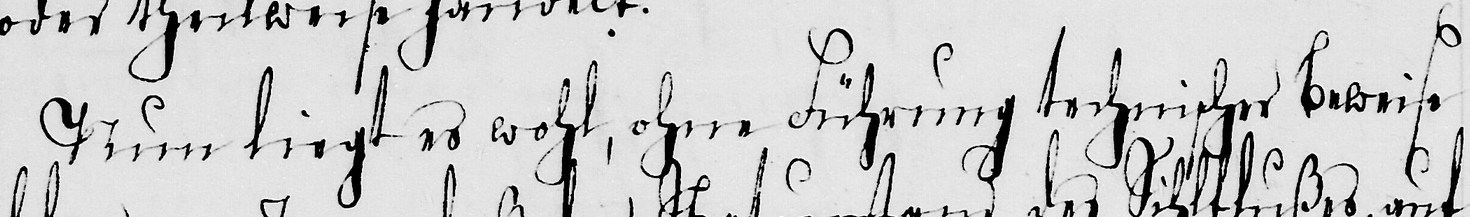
Nun liegt es wohl, ohne Führung technischer Beweise
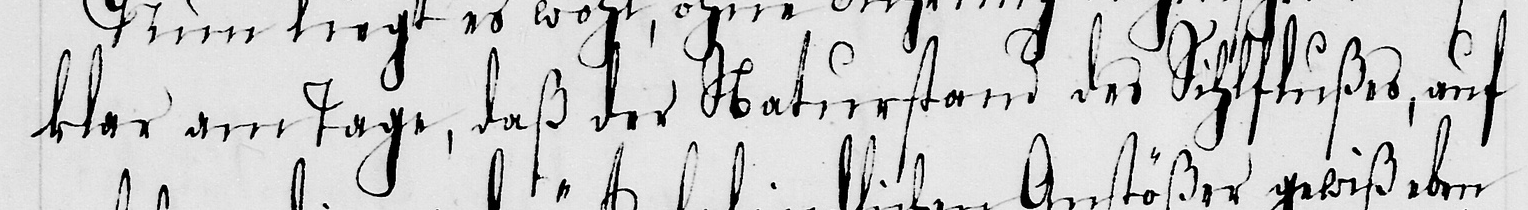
klar am Tage, daß der Naturzustand des Sihlflußes, auf
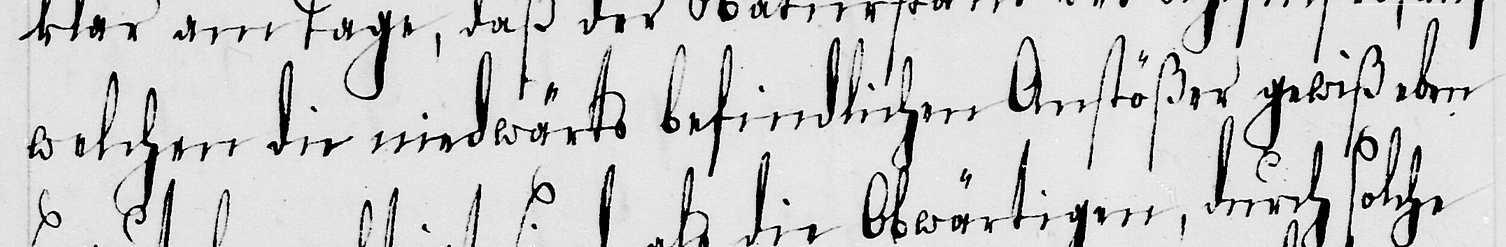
welchen die niedwärts befindlichen Anstößer gewiß eben
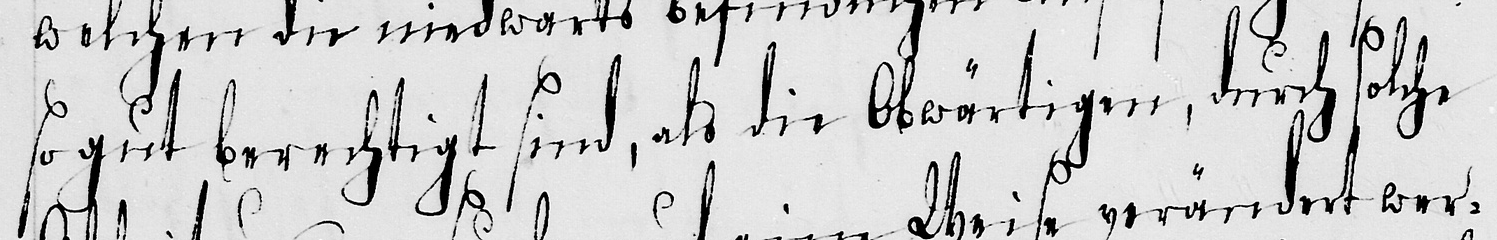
so gut berechtigt sind, als die Abwärtigen, durch solche
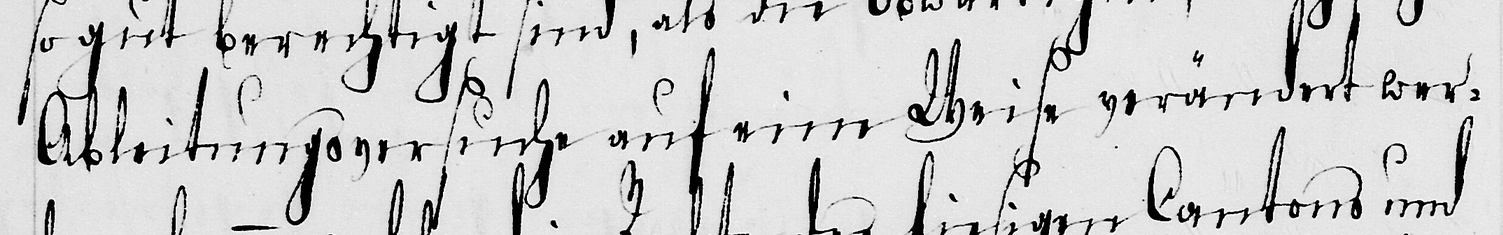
Ableitungsversuche auf eine Weise verändert wer¬
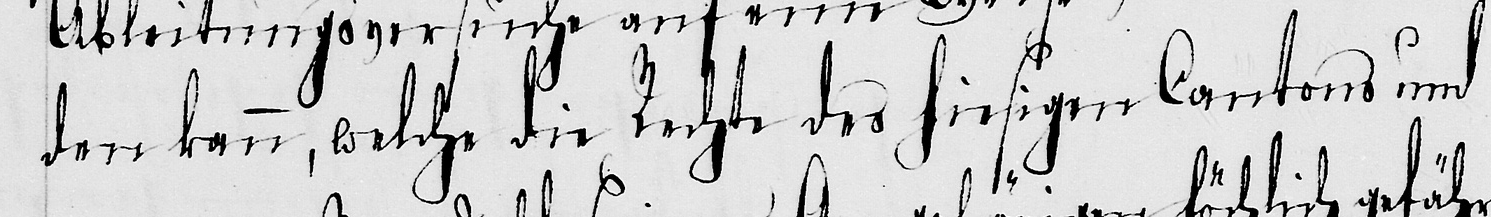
den kann, welche die Rechte des hiesigen Cantons und
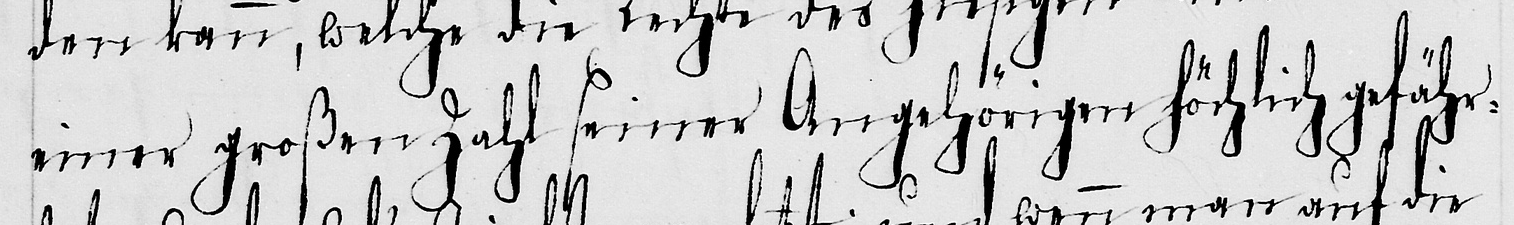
einer großen Zahl seiner Angehörigen höchlich gefähr¬
